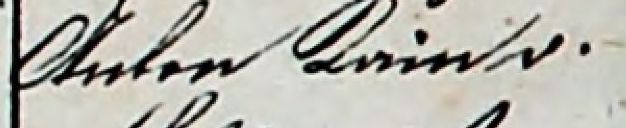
Anton Kain v.
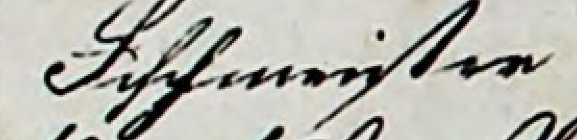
Fischmeister
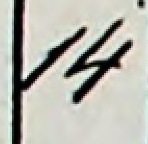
14
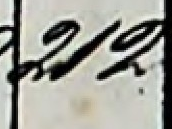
212
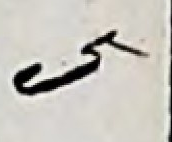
5
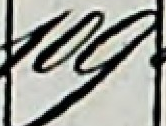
109
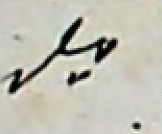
do
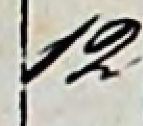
12
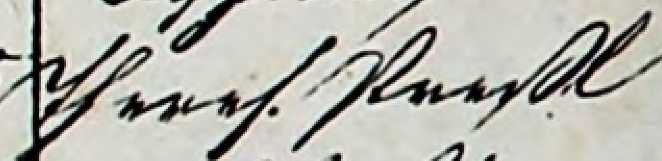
Theres. Preßl
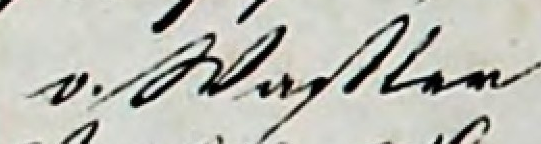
v. Wastler
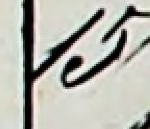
15
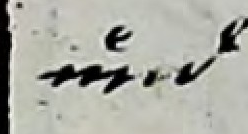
und
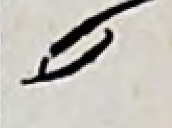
6
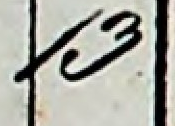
13
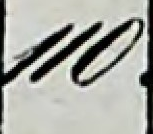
110
